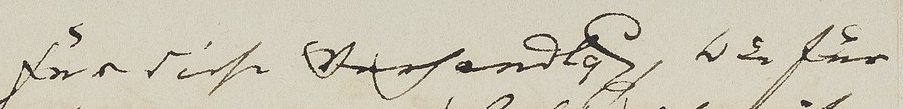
für diese Verhandlungen , wie für
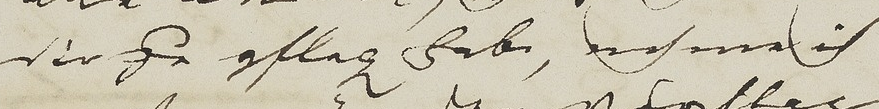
Dir zu pflegen habe, nehme ich
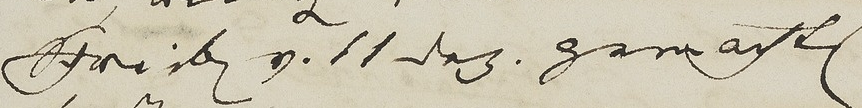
Schreiben v. 11 Dez. gemacht
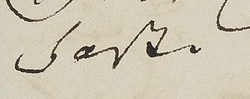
hast.
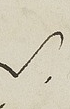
D.
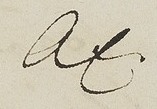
A E.
